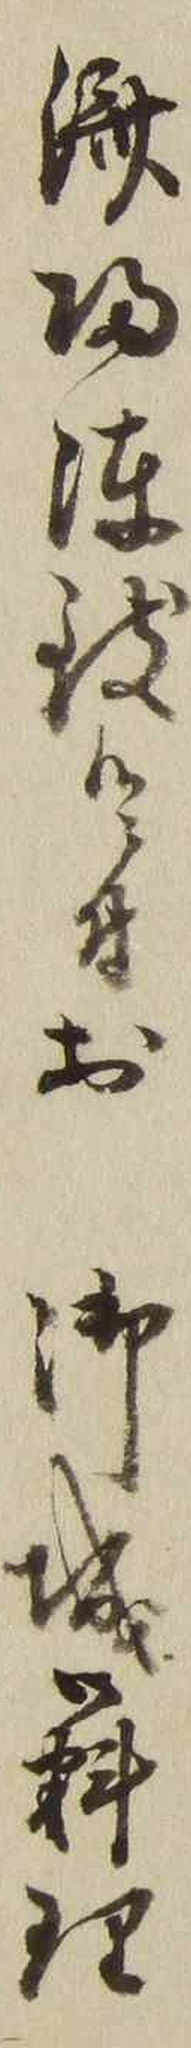済帰陣致候ニ付於御城御料理

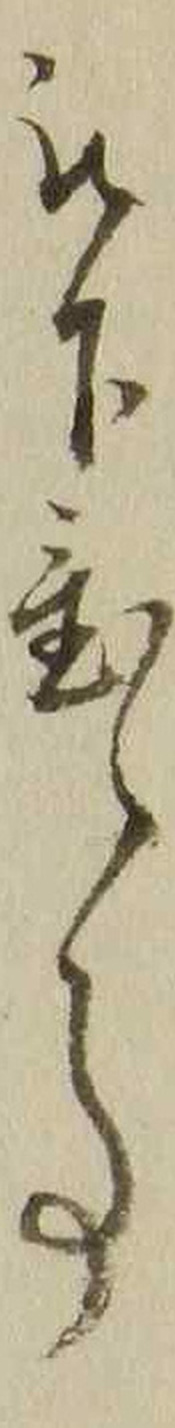被下置候事
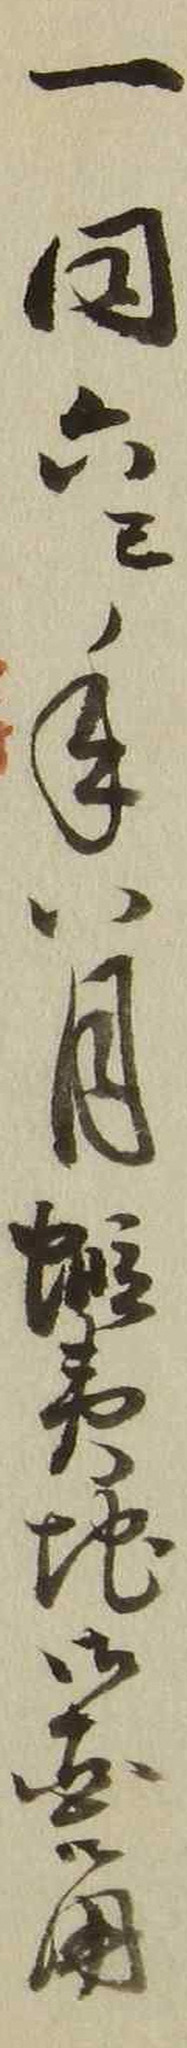一同六巳年八月蝦夷地御固御用
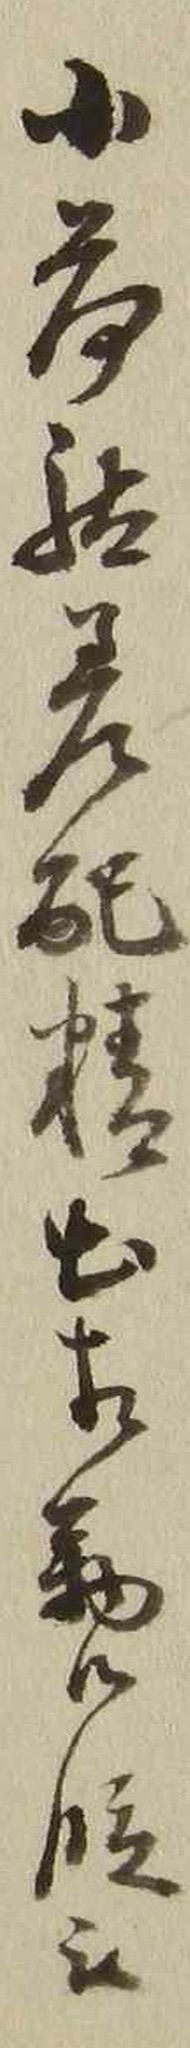小荷駄差配精出相勤候段被
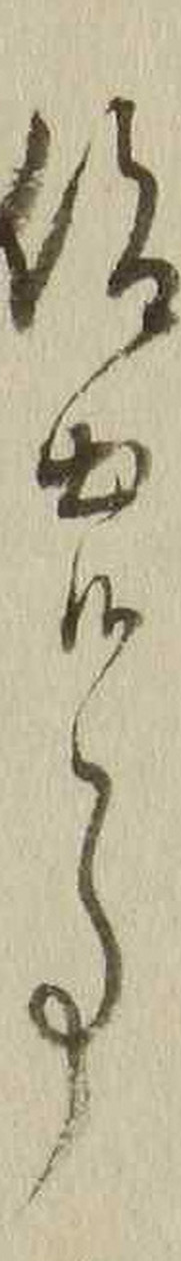仰出候事
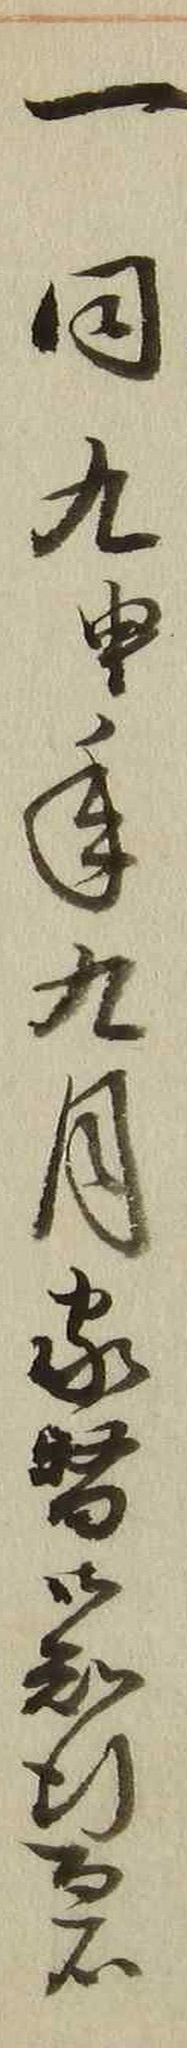一同九申年九月家督御知行百石
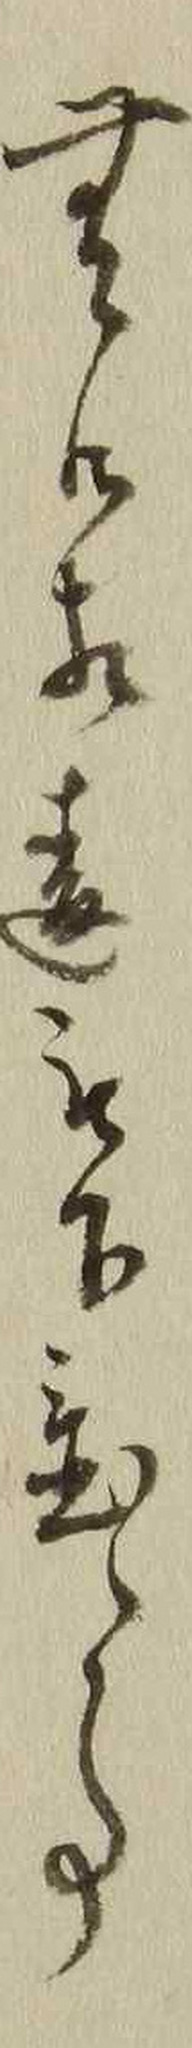無御相違被下置候事
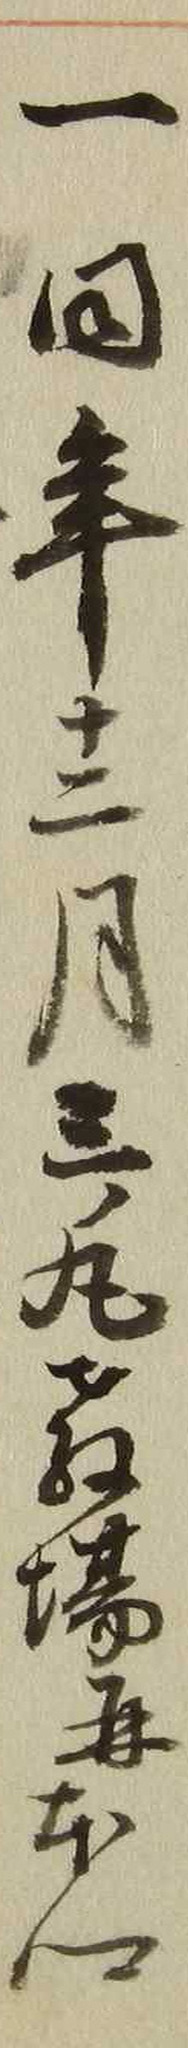一同年十二月三ノ丸教場幷本郷
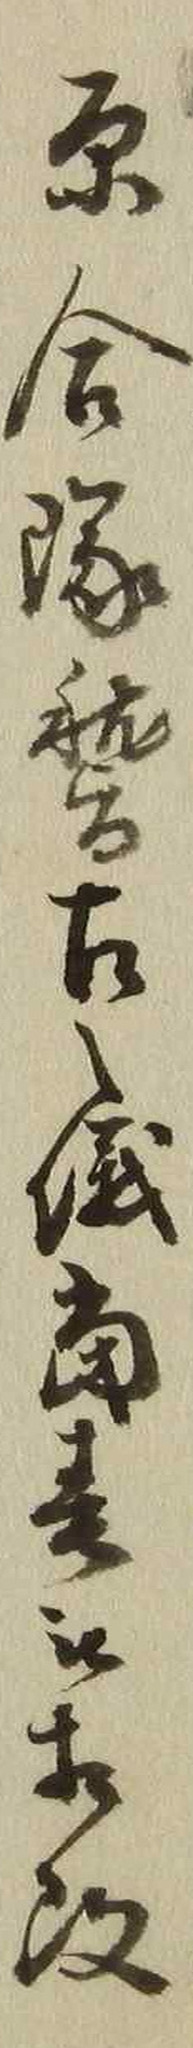原合隊稽古之儀当春被相改
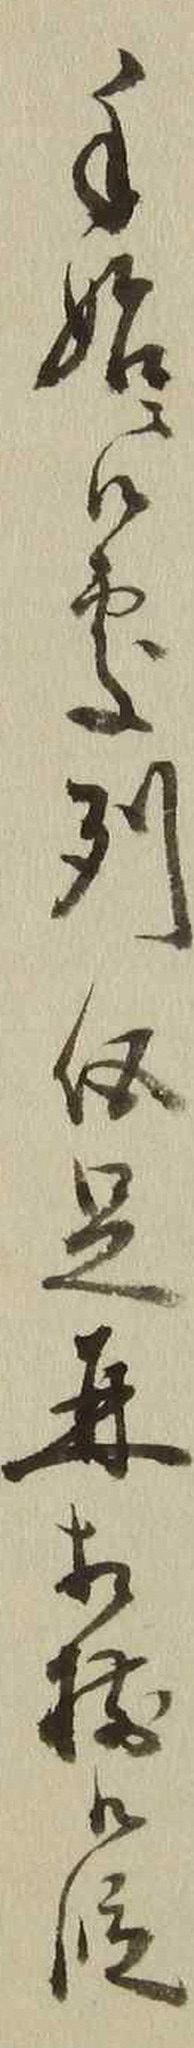手始ニ候処列伍足並相揃候段
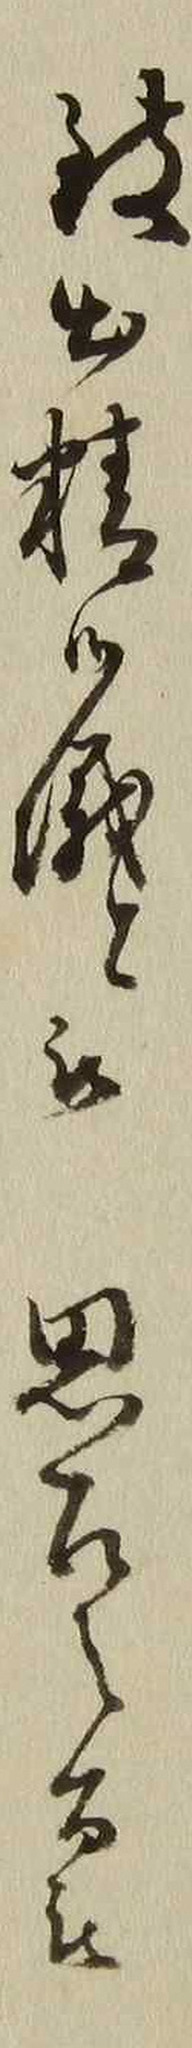致出精候儀と被思召之旨被
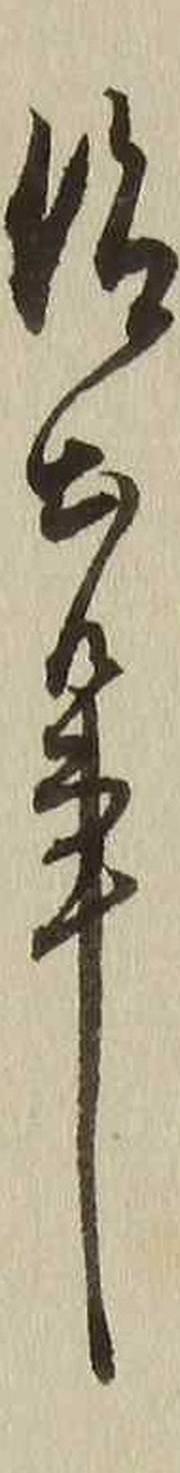仰出候事
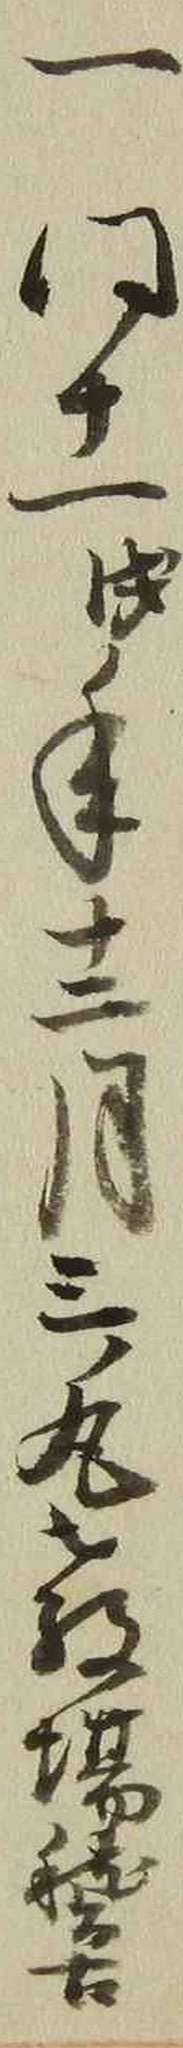一同十一戌年十二月三ノ丸教場稽古
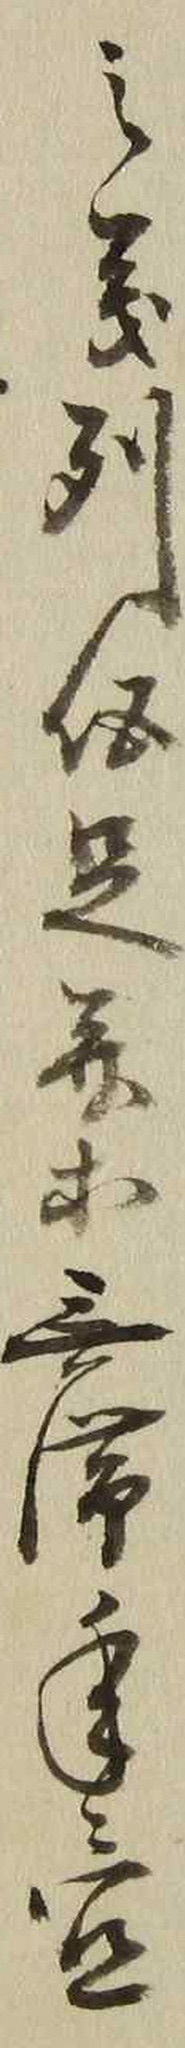之義列伍足幷等無滞年々宜
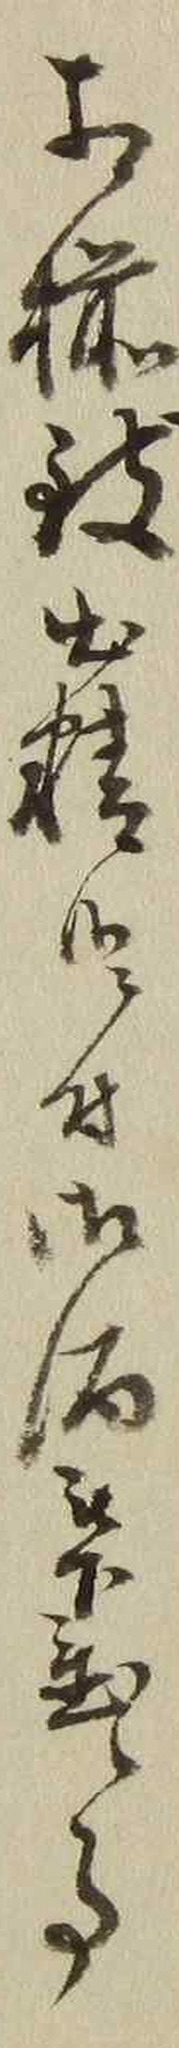相揃致出精候ニ付御酒被下置候事
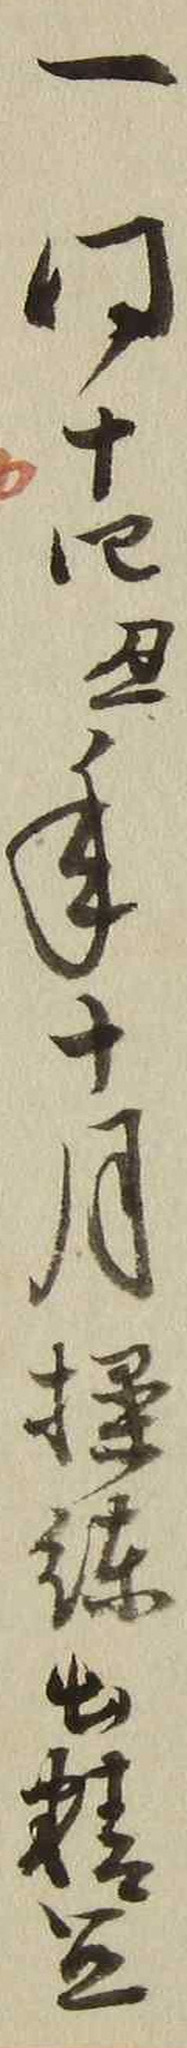一同十四丑年十月操練出精宜
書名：諸士系譜　巻之53　に之部4
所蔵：会津若松市立会津図書館
